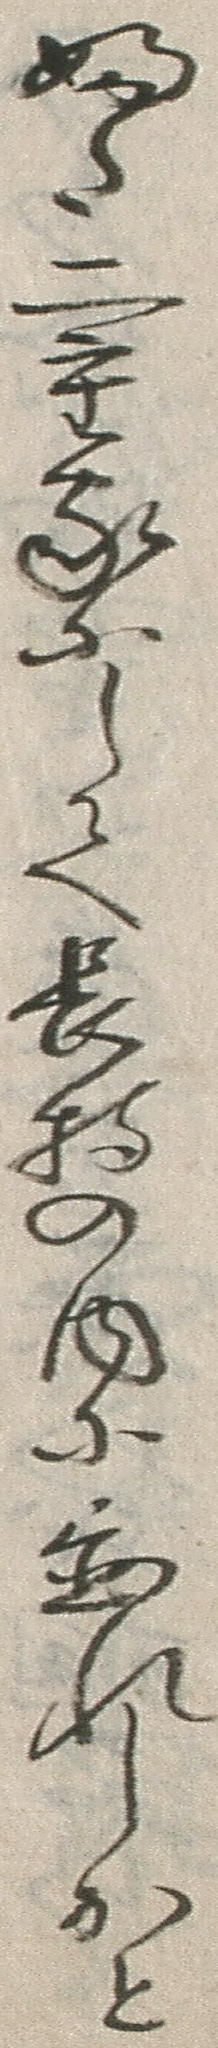ふた二重家にして長持の内に置れしかと
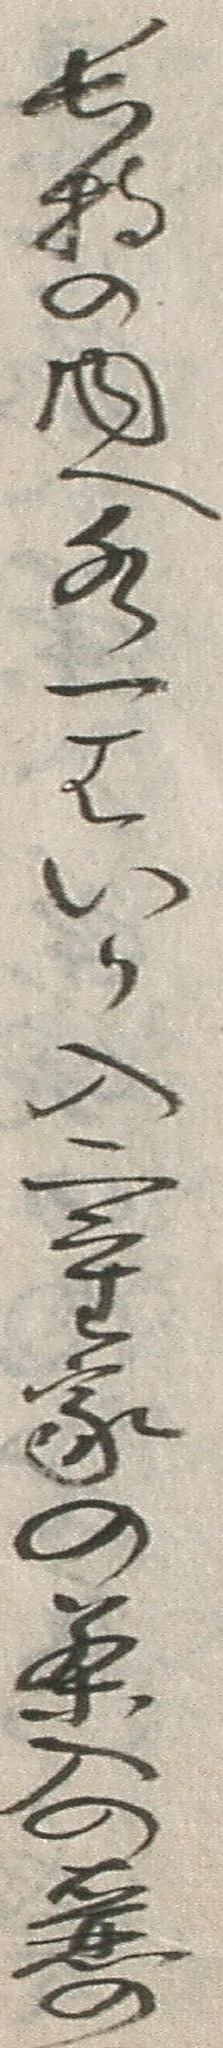長持の内へ水一はいり入二重家の茶入の壷の
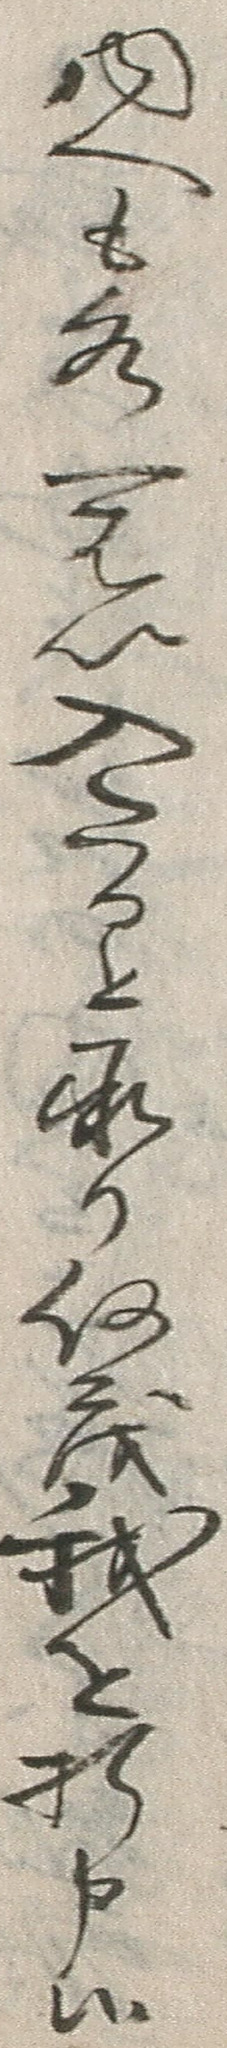内へも水一はい入たると承り何も我を折申候
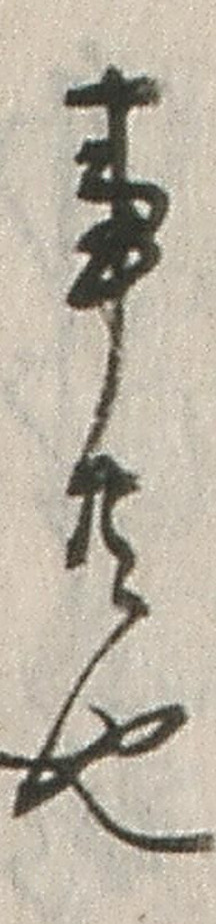事共也
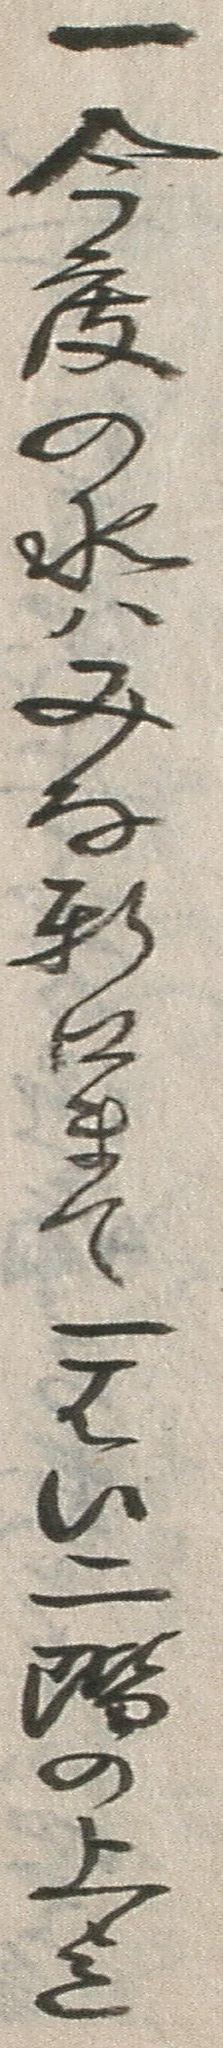一今度の水はみな軒口まて一はい二階の上迄
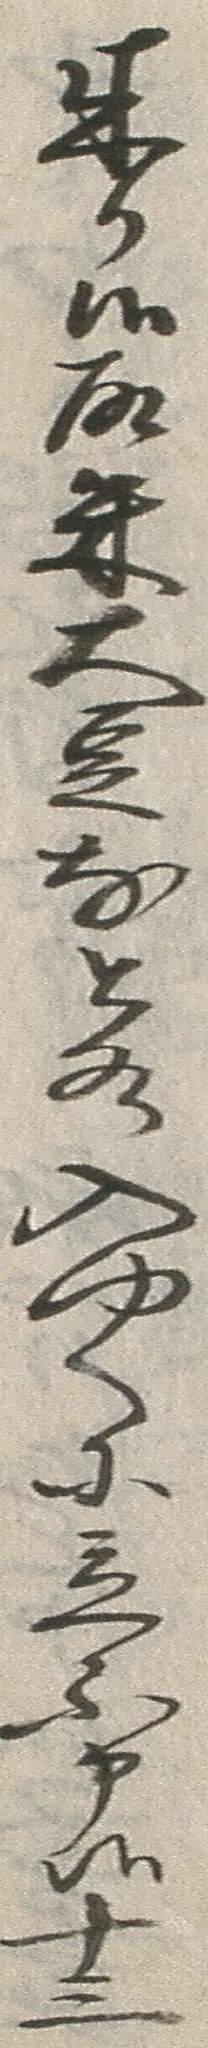来り候故米大豆なと水入ゆへに立不申候十三
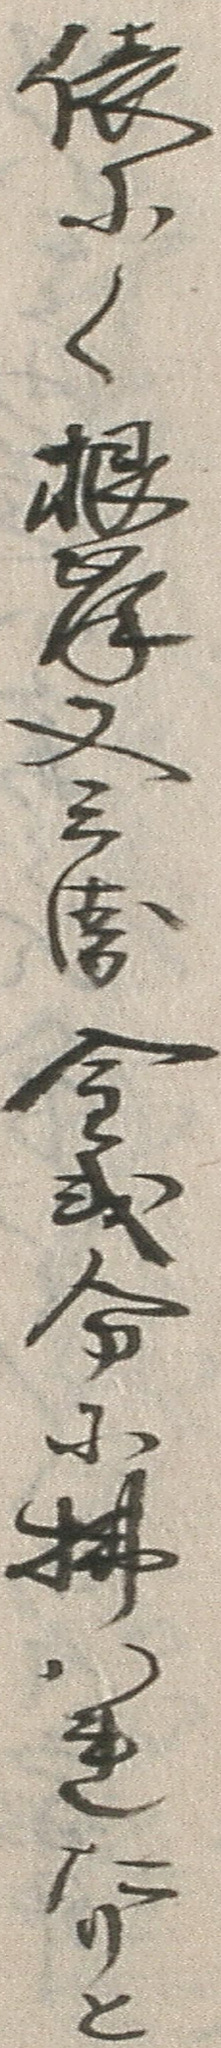俵にて根岸又兵衛金弐分に払はれたりと
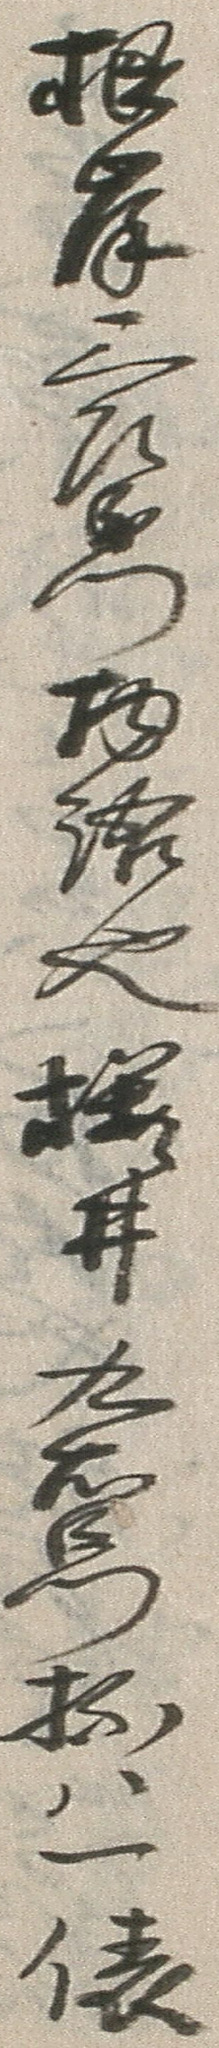根岸三左衛門物語也桜井九右衛門抔は一俵
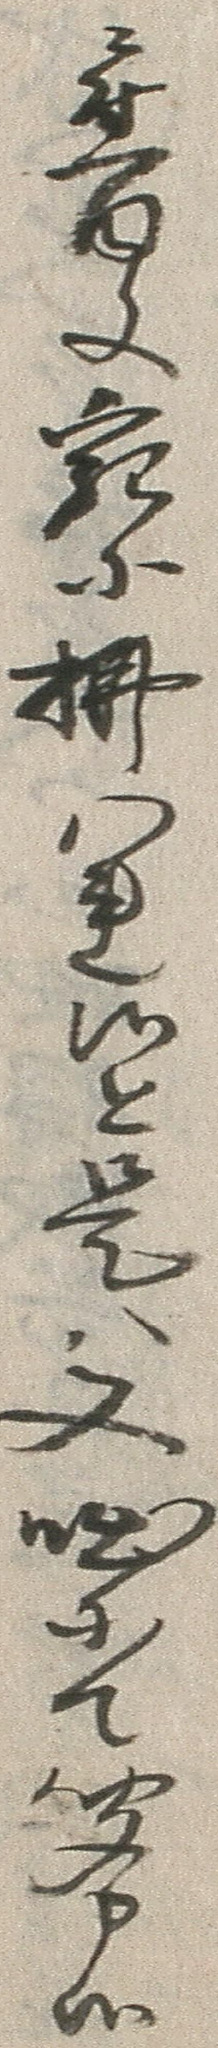に付百文宛に払はれ候と是は又咄にて聞申候
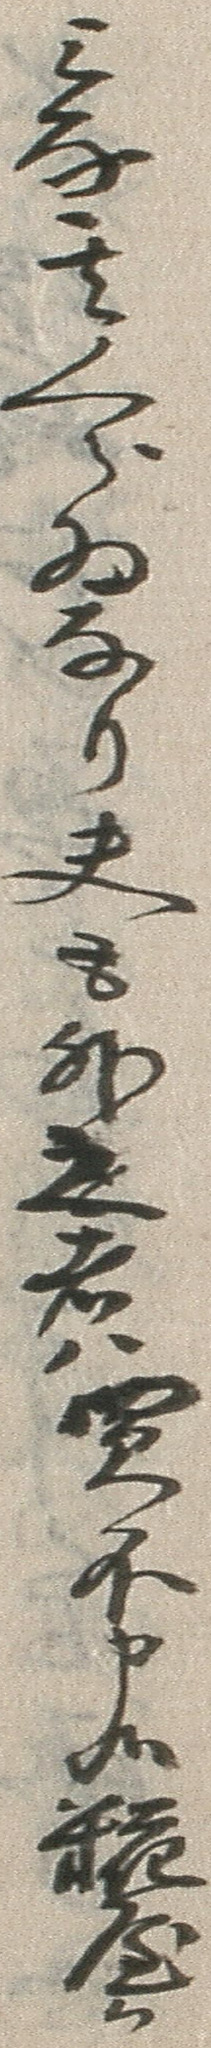みな其くらゐなり夫も外之者は買不申候糀屋か
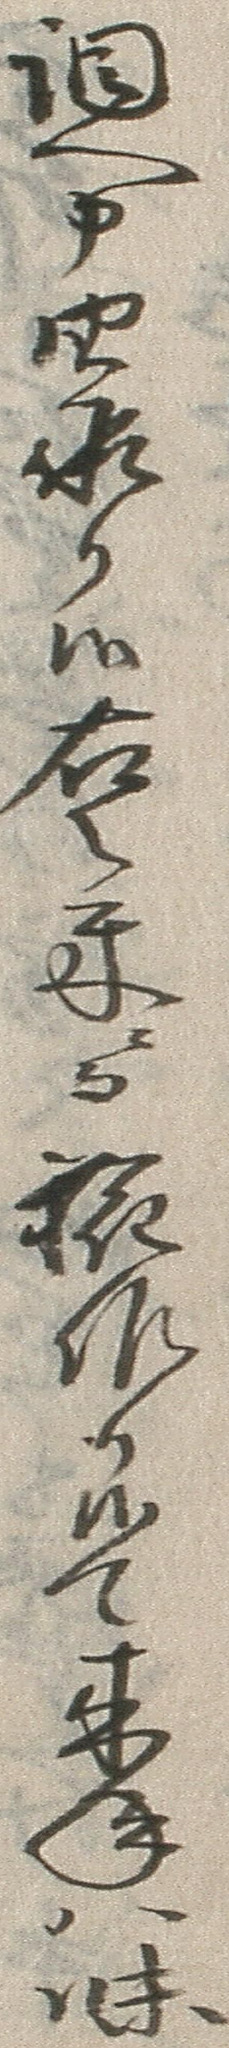調へ申由承り候右之米にて糀作り候て来年は味
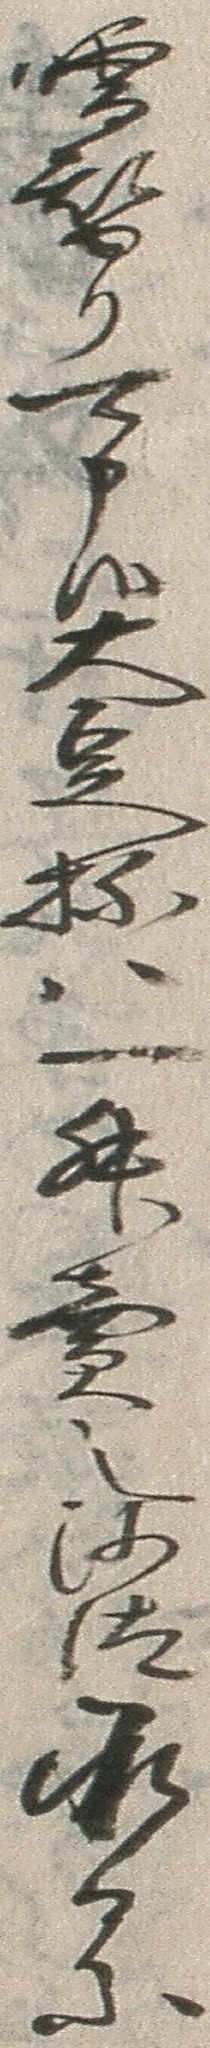噌替り可申候大豆抔は一升売之沙汰承るに
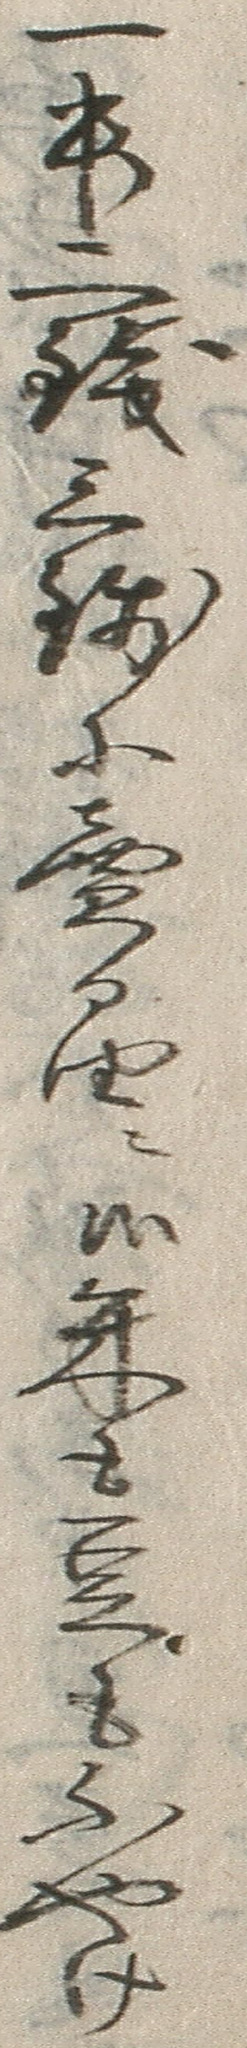一升二銭三銭に売る由に候米も豆もふやけ
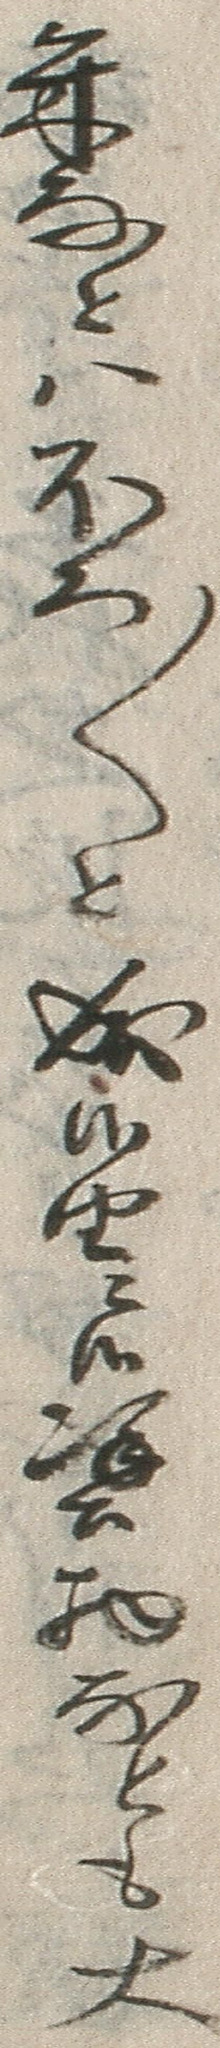米なとはほろ〳〵と成候由に候壁物なとも大
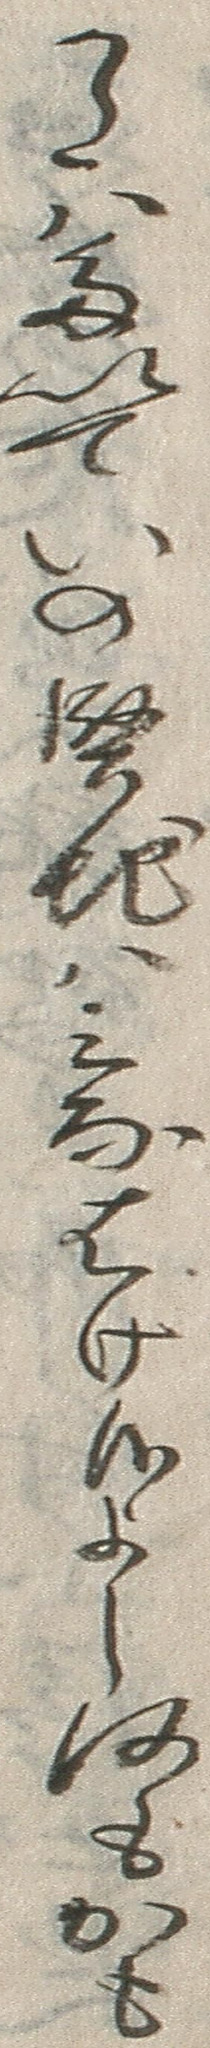かたはたいていの堅地はみなはけ候よし何もかも
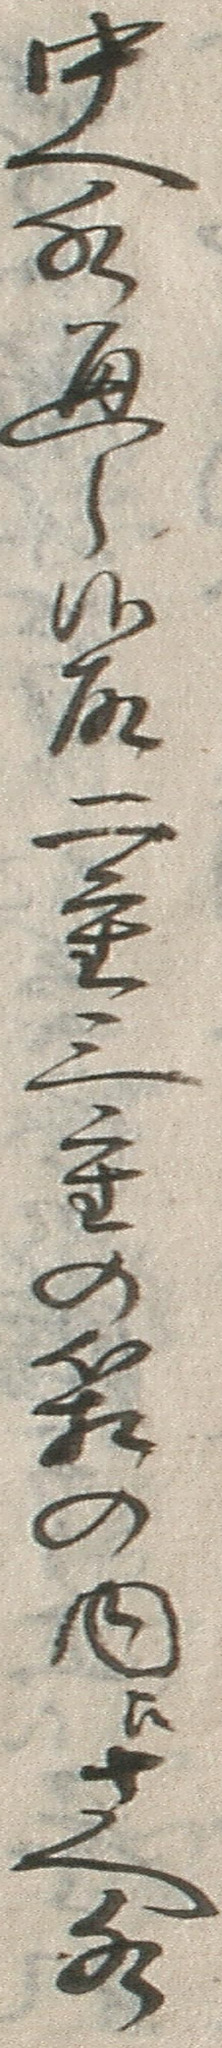中へ水通し候故二重三重の箱の内えさへ水
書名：享保十三年江戸洪水記
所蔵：東京大学地震研究所図書室 Earthquake Research Institute Library, The University of Tokyo, JAPAN
